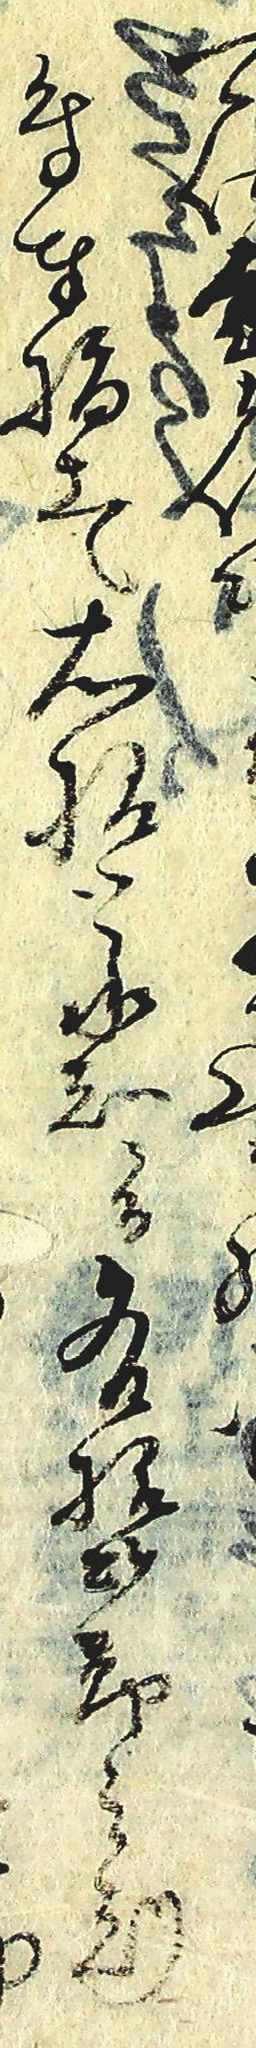付奉指上候右様御承知にて各様出勤之割
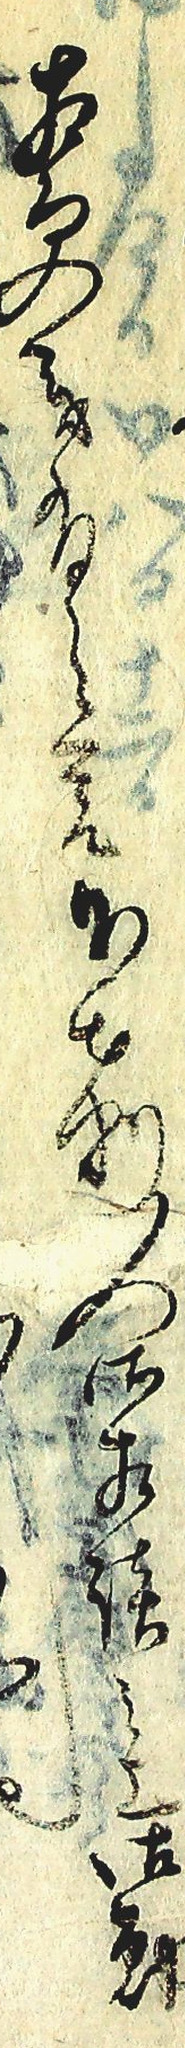相受義有之節下才判人御相談之上御勤
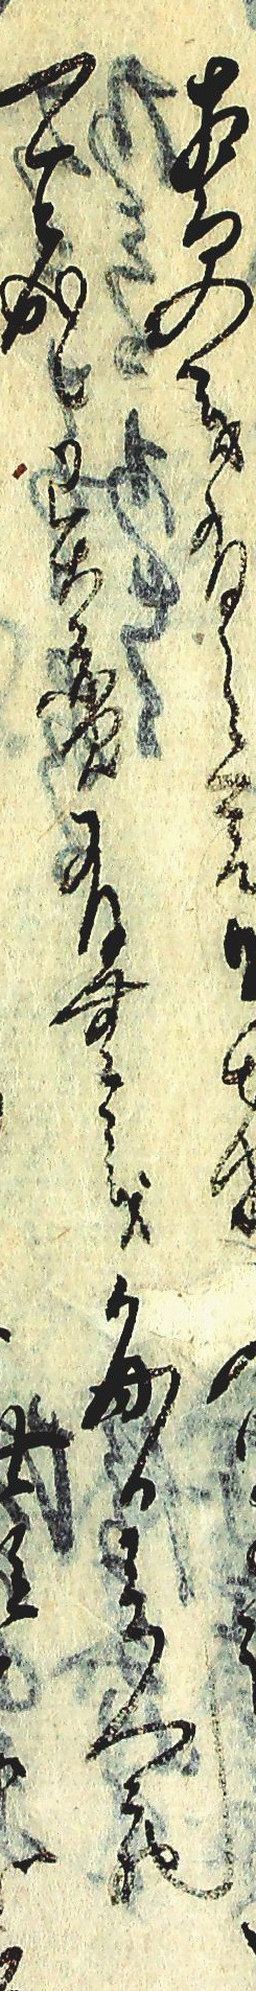可被成候異変有無之義毎日壱人宛
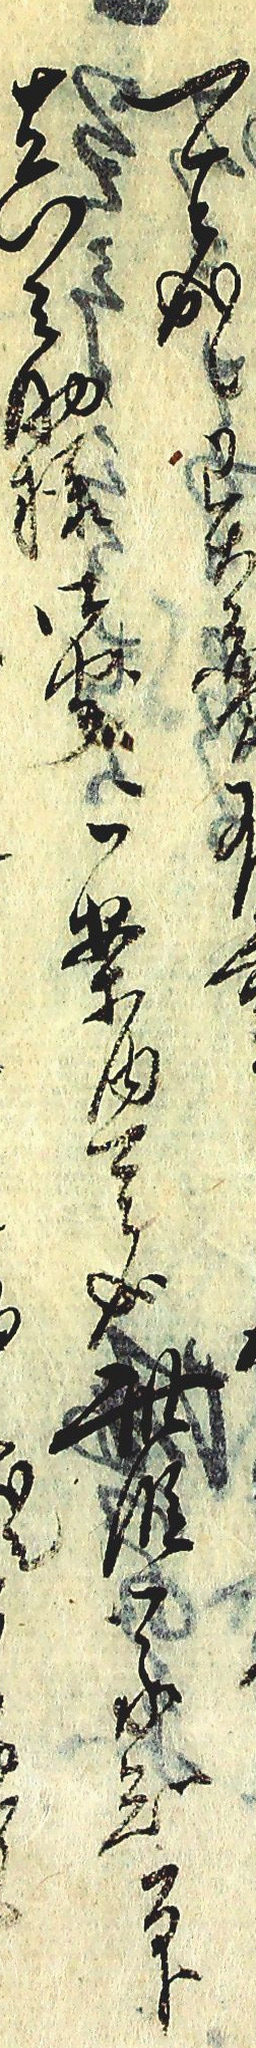真之助様御宅へ御案内可被成此段御承知印
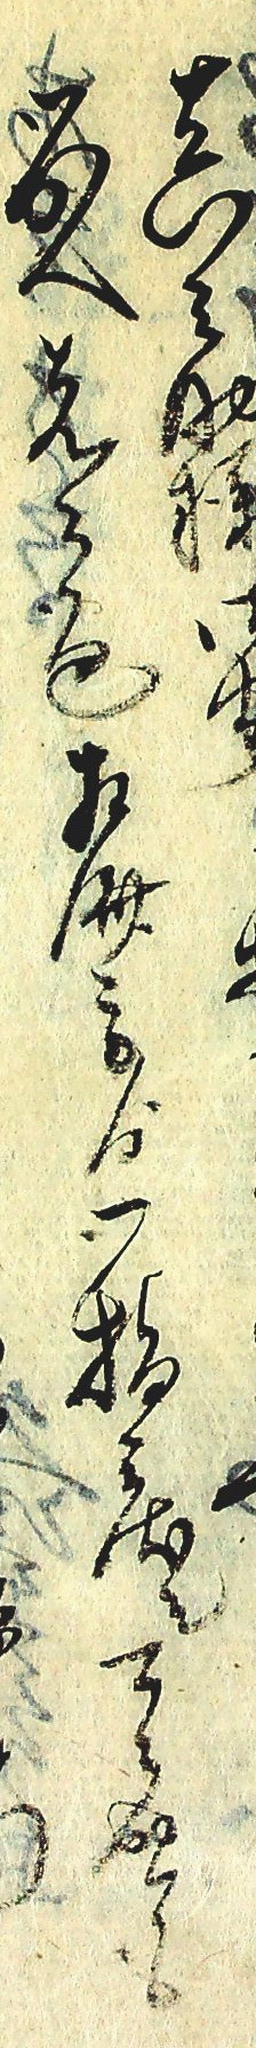御加へ先々御廻相済方ゟ御指戻し可被成候以上
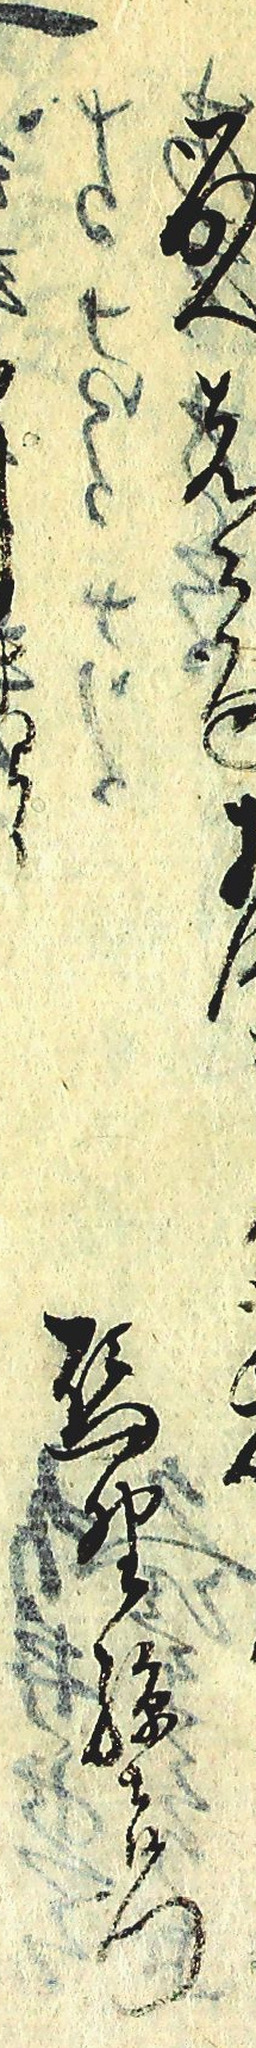鷹野孫右衛門
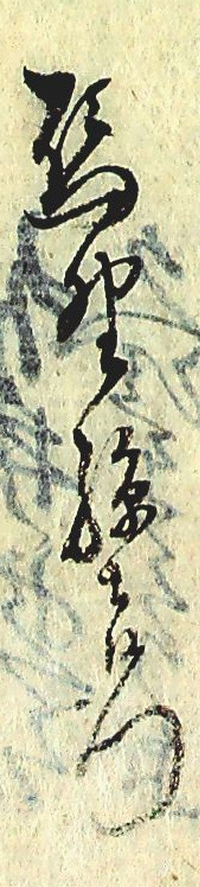鷹野孫右衛門
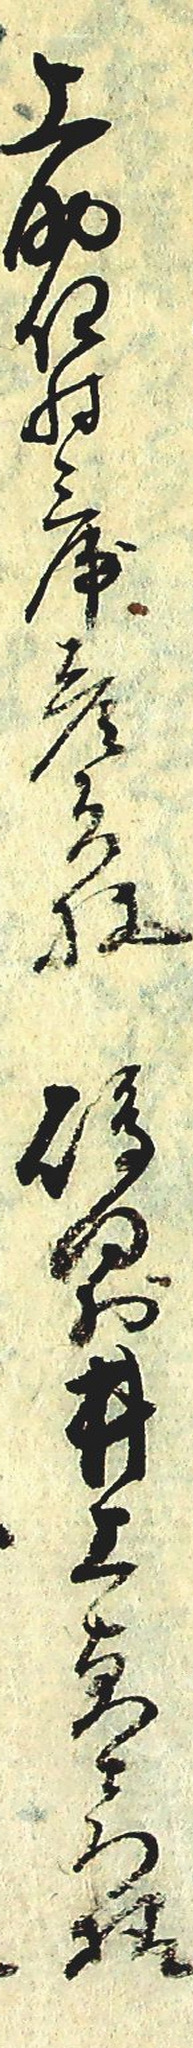上助任村三浦彦吉様島田村井上貞右衛門様
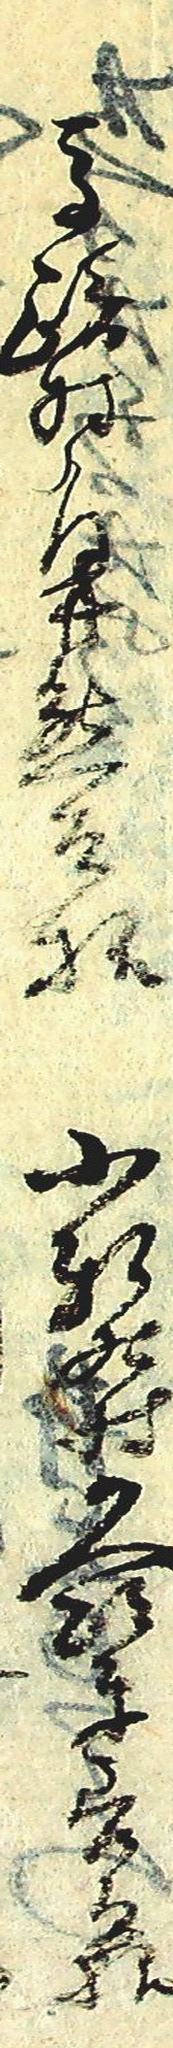高崎村有井熊太様北新居村久須米善兵衛様
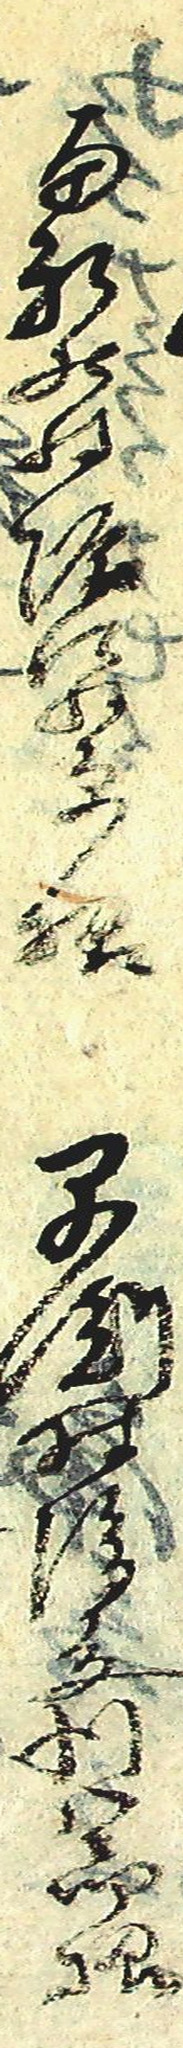南新居村堀江九兵衛様早淵村後藤利八郎様
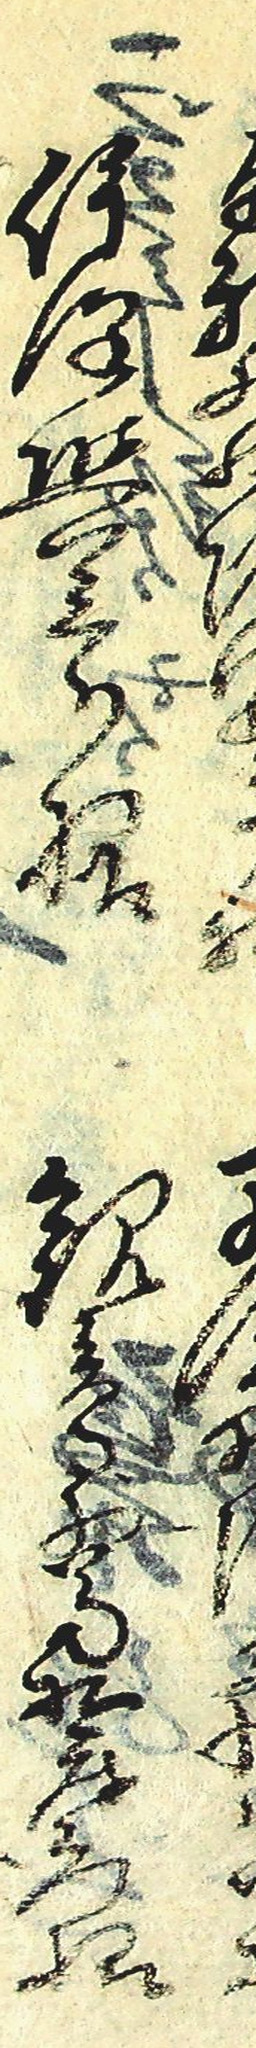伊沢与三郎様観音寺村冨松茂右衛門様
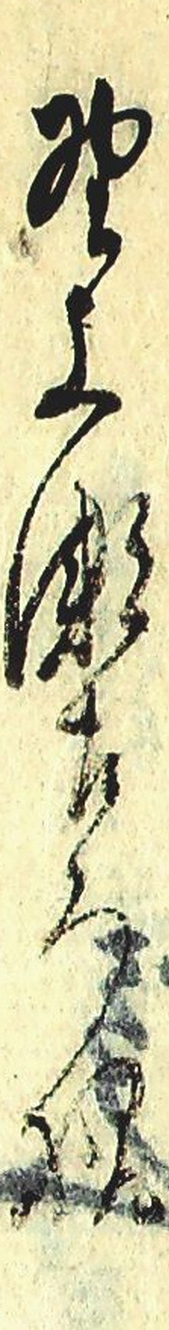野上瀬左衛門様

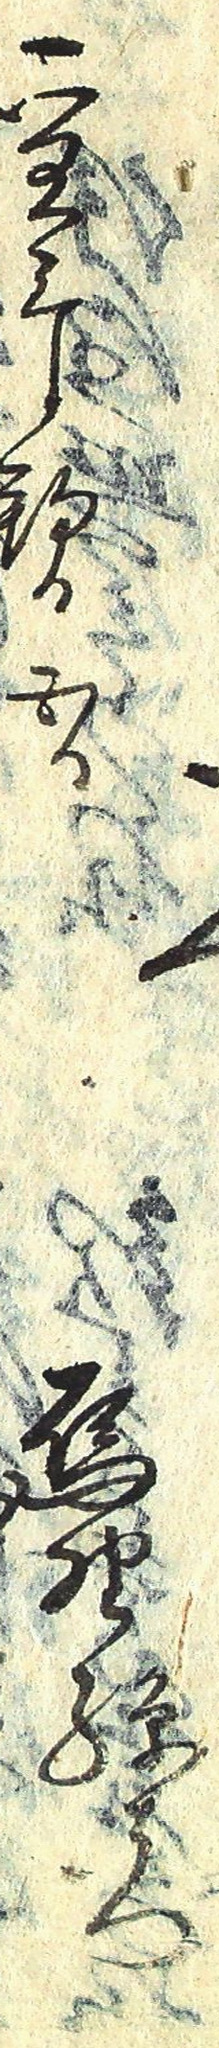一閏三月朔日五日鷹野孫右衛門
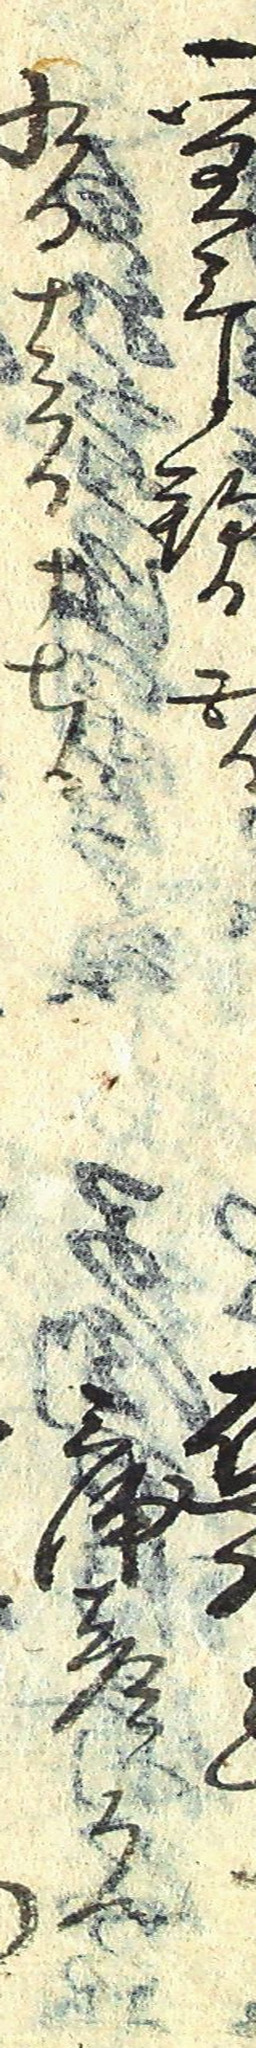九日十三日十七日三浦彦吉
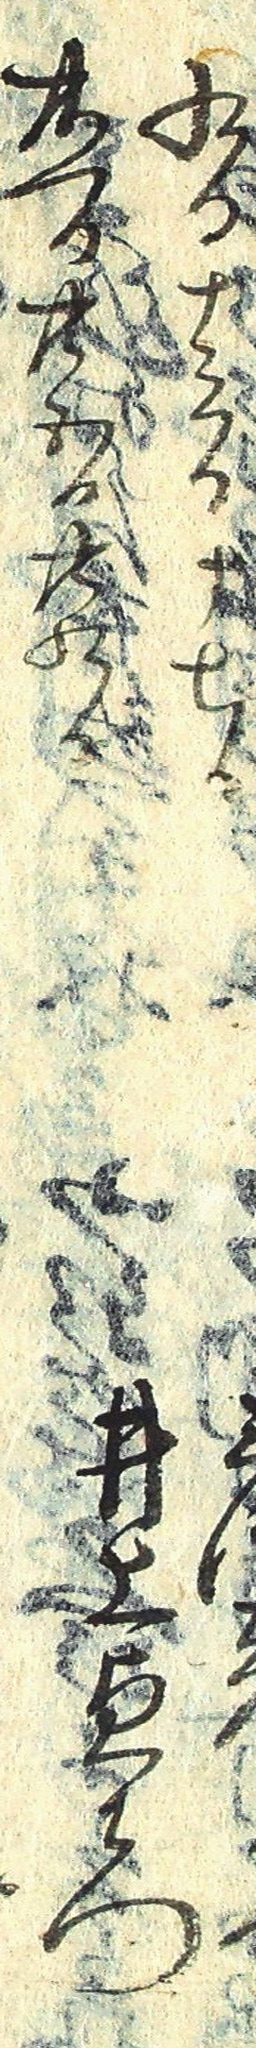廿一日廿五日廿九日井上貞右衛門
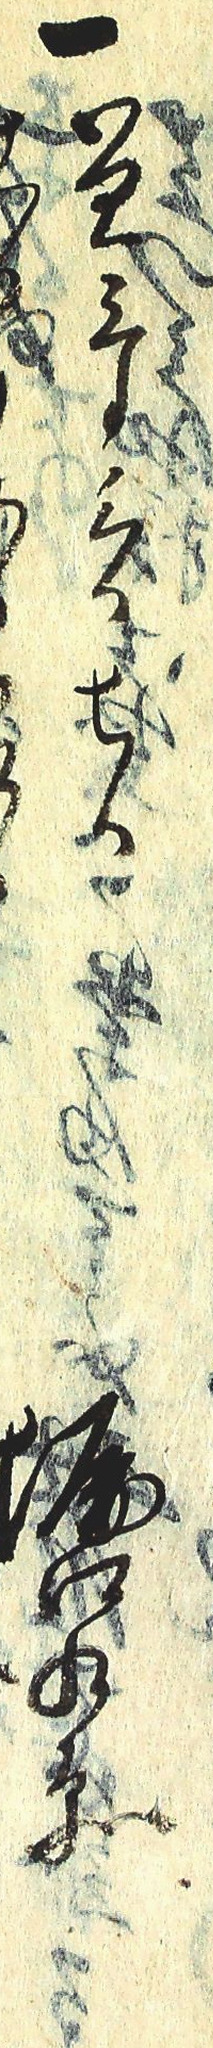一閏三月三日七日堀江九兵衛
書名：諸御願書控(弐番）
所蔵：鳴門教育大学 Naruto University of Education
